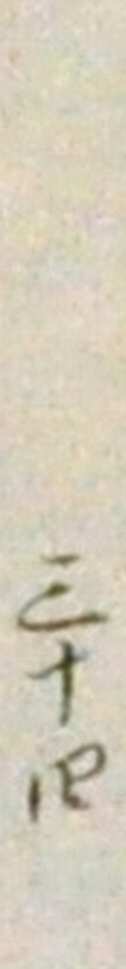三十四
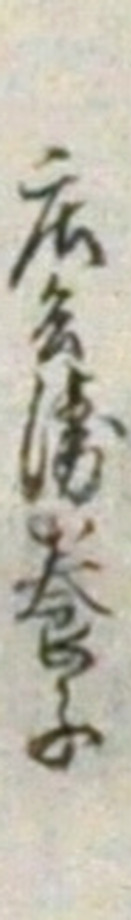庄兵衛養子
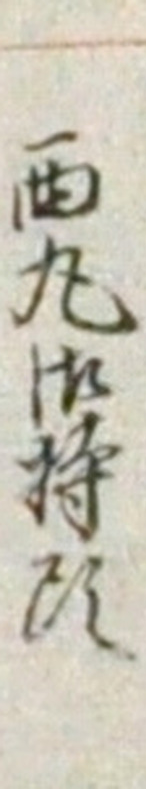西丸御持頭
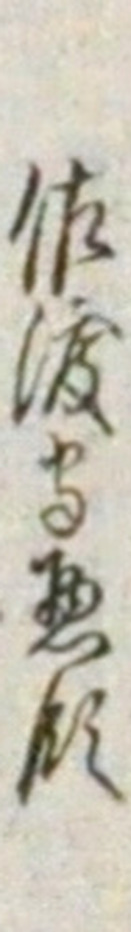佐渡守惣領
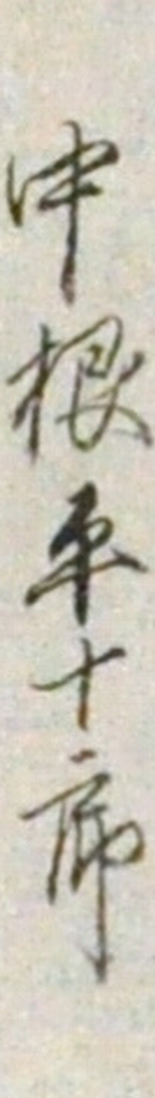中根平十郎
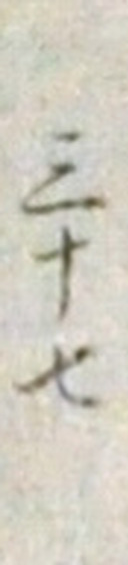三十七
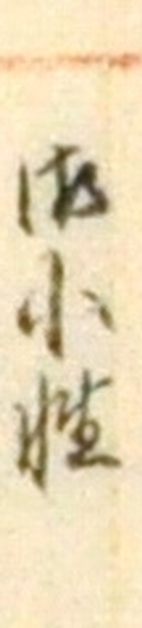御小性
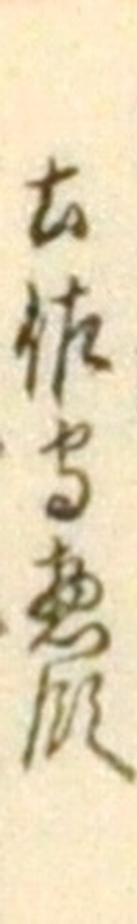土佐守惣領
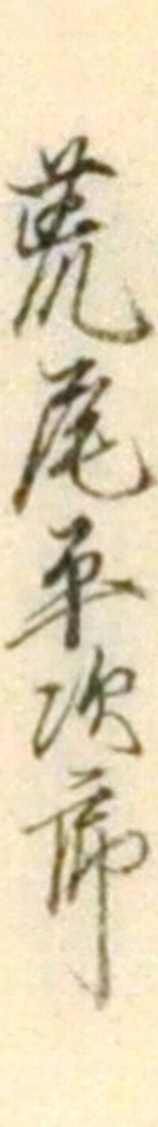荒尾平次郎

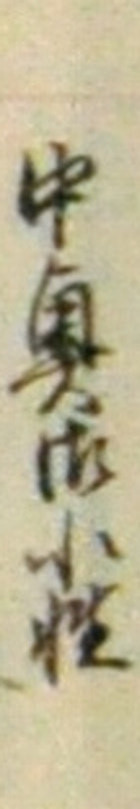中奥御小性
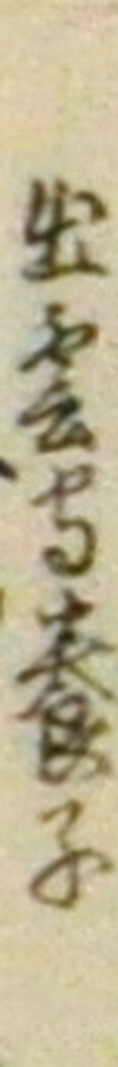出雲守養子
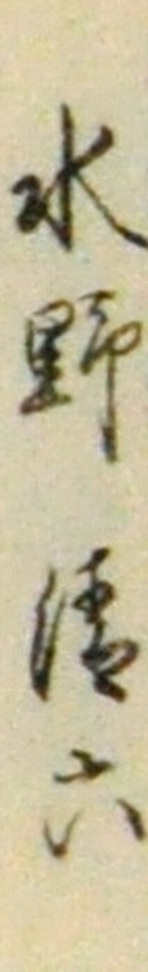水野清六
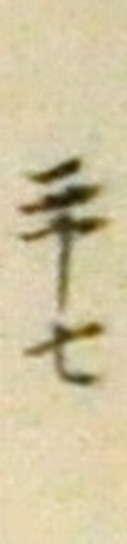二十七
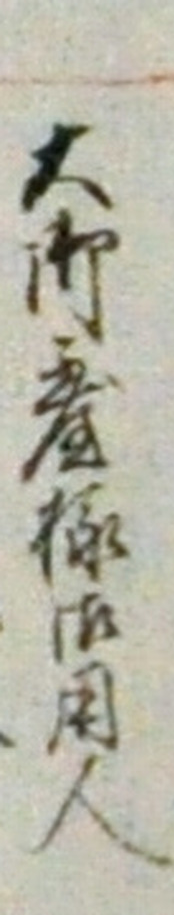大御台様御用人
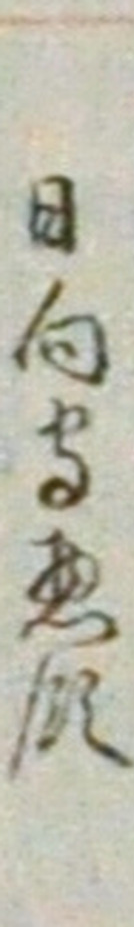日向守惣領
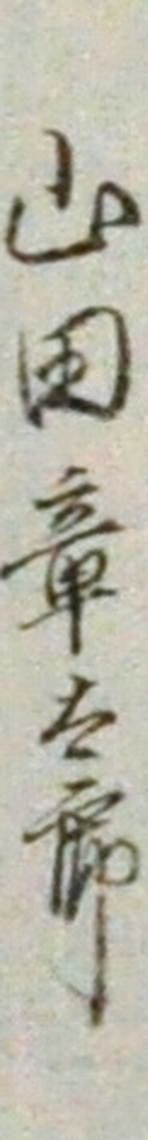山田章太郎
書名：若年寄御役中之御書物〔一括〕
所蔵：伊那市立高遠町図書館・合同会社AMANE
